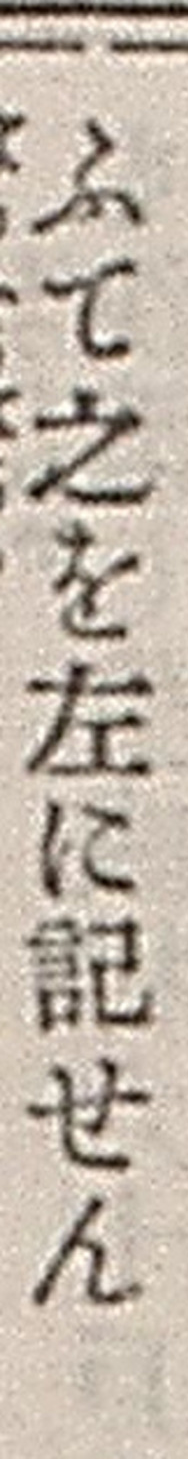ふて之を左に記せん
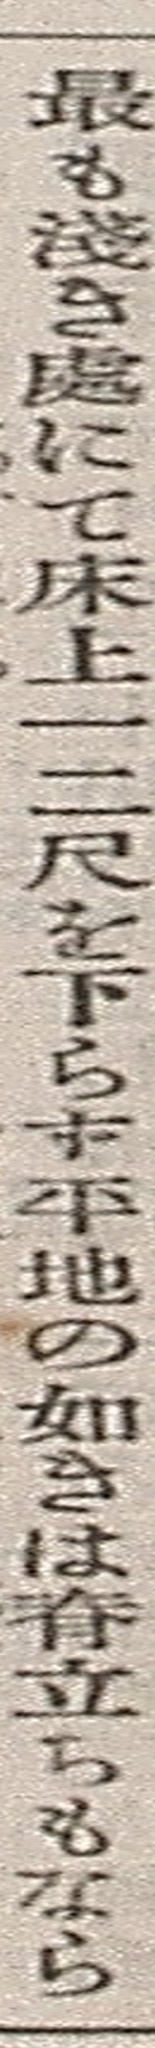最も浅き処にて床上一二尺を下らず平地の如きは脊立ちもなら
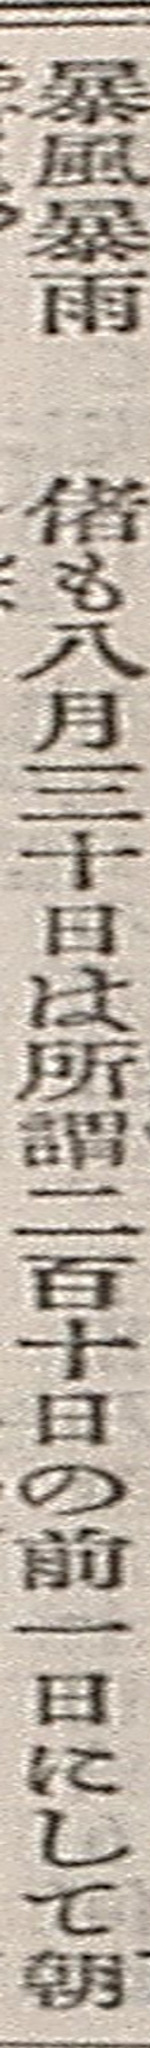暴風暴雨偖も八月三十日は所謂二百十日の前一日にして朝
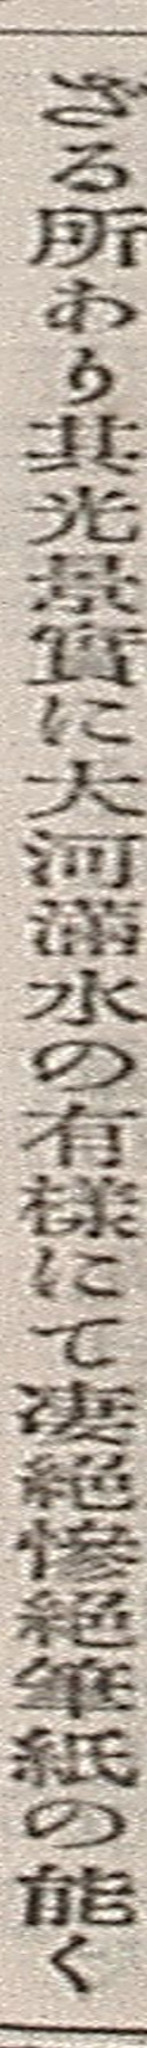ざる所あり其光景実に大河満水の有様にて凄絶惨絶筆紙の能く
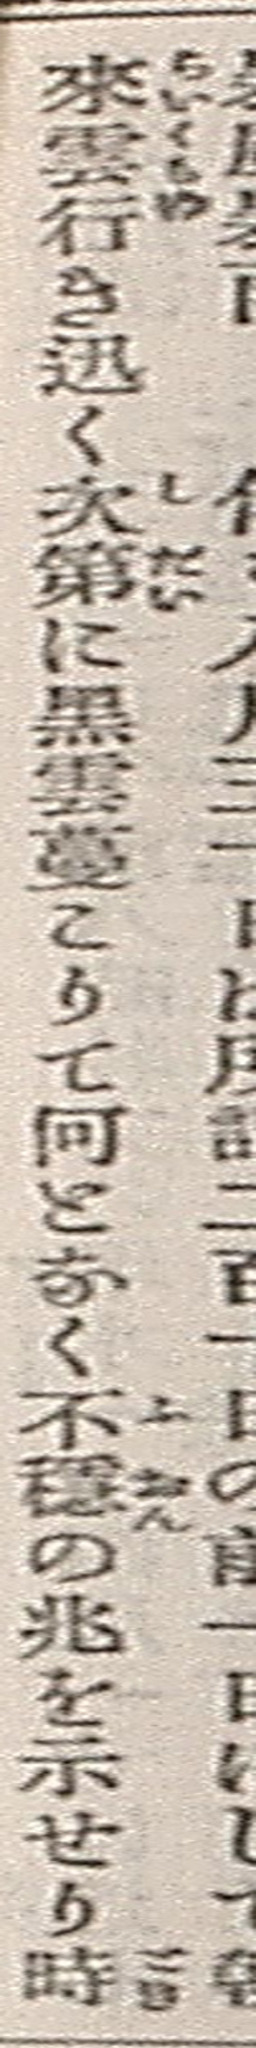來雲行き迅く次第に黒雲蔓こりて何となく不穏の兆を示せり時
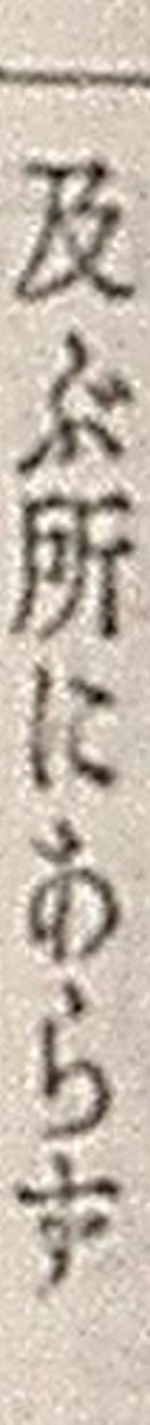及ぶ所にあらず

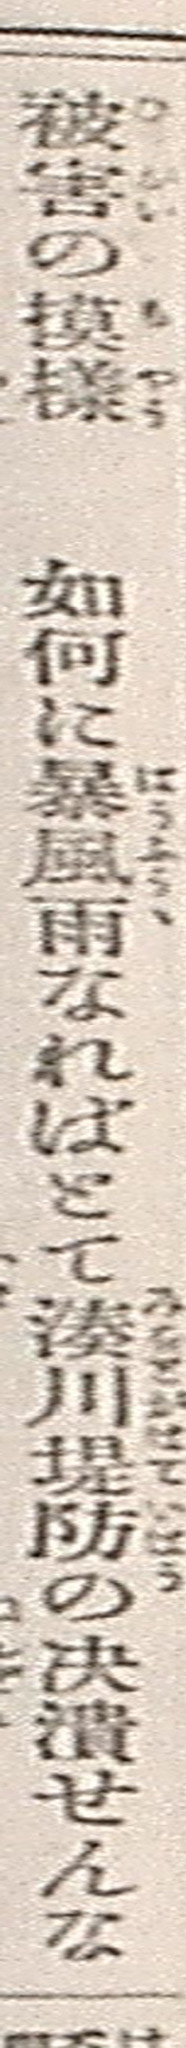被害の模様如何に暴風雨なればとて湊川堤防の决潰せんな
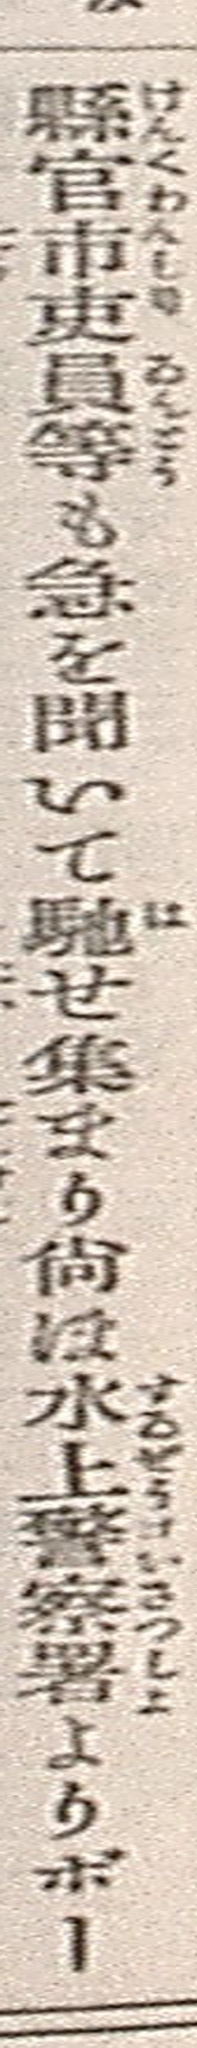警官市吏員等も急を聞いて馳せ集まり尚ほ水上警察署よりボー
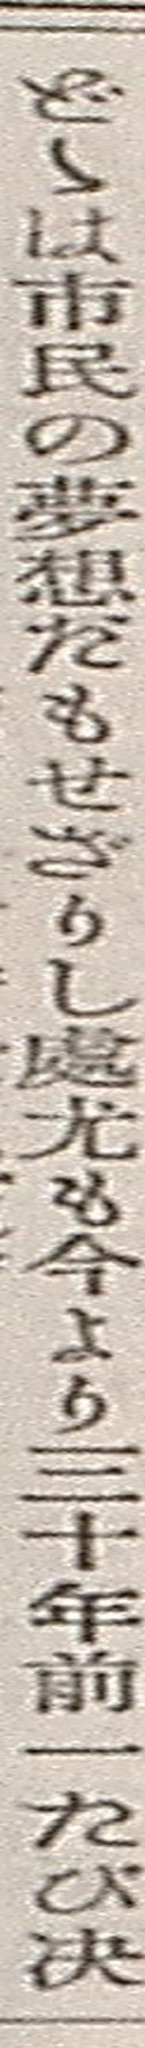どゝは市民の夢想だもせざりし処尤も今より三十年前一たび决
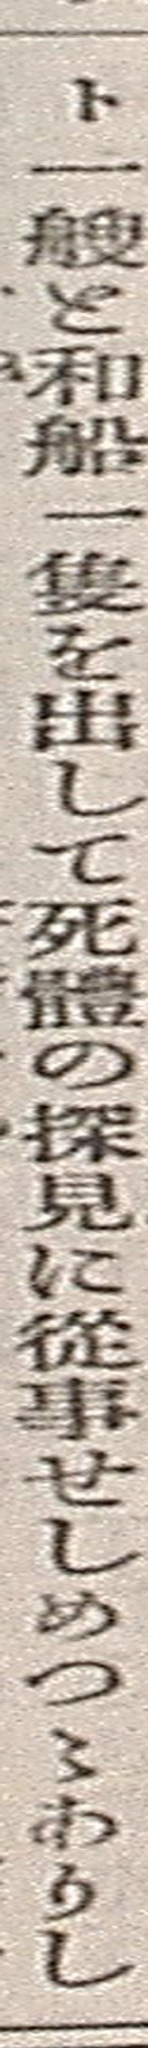ト一艘と和船一隻を出して死体の探見に従事せしめつゝありし
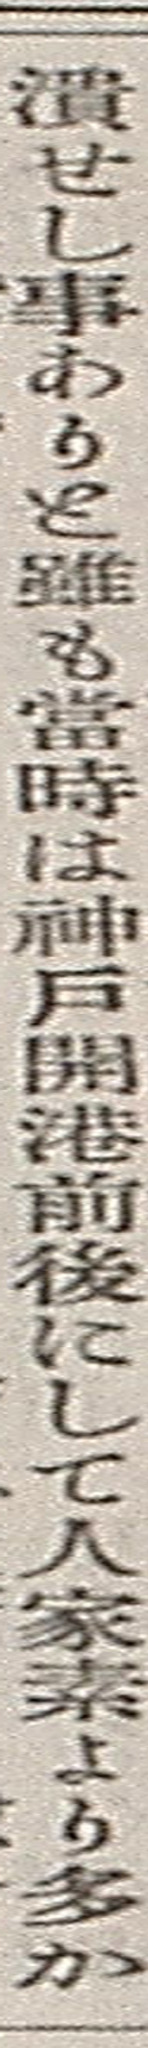潰せし事ありと雖も当時は神戸開港前後にして人家素より多か
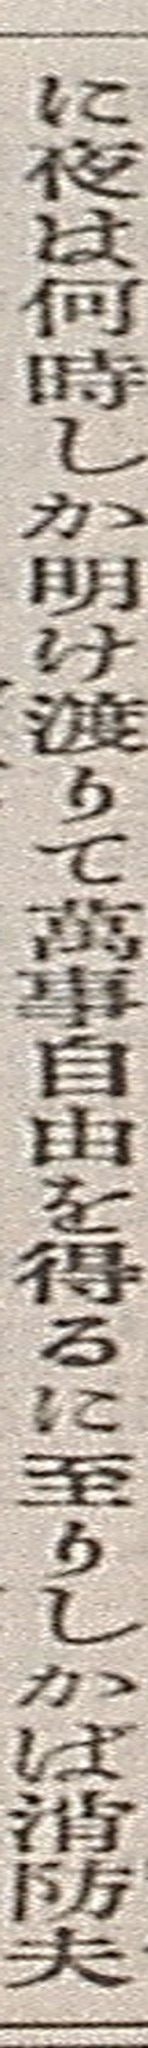に夜は何時しか明け渡りて万事自由を得るに至りしかば消防夫
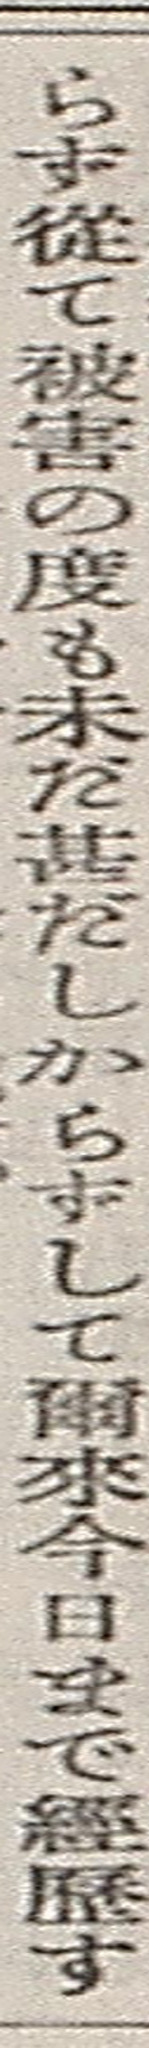らず従て被害の度も未だ甚だしからずして爾来今日まで経歴す
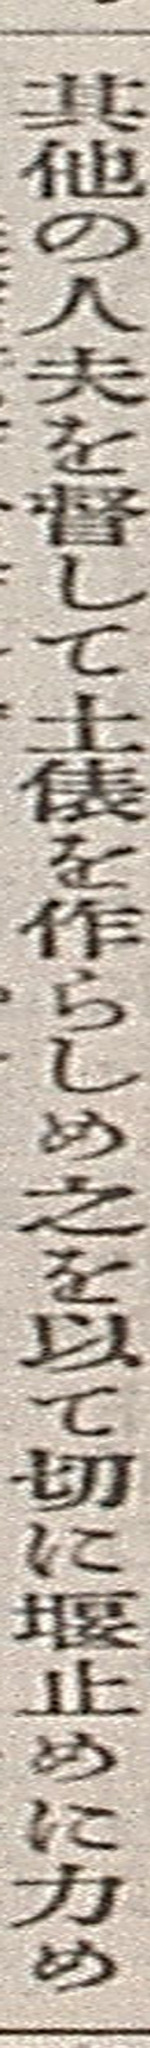其他の人夫を督して土俵を作らしめ之を以て切に堰止めに力め
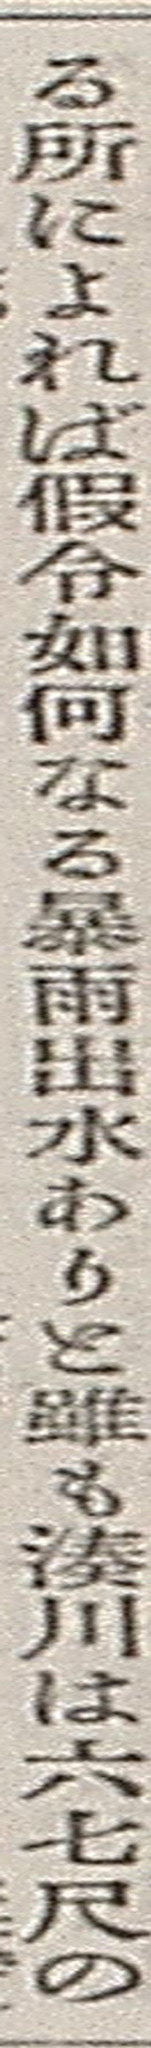る所によてば仮令如何なる暴風出水ありと雖も湊川は六七尺の
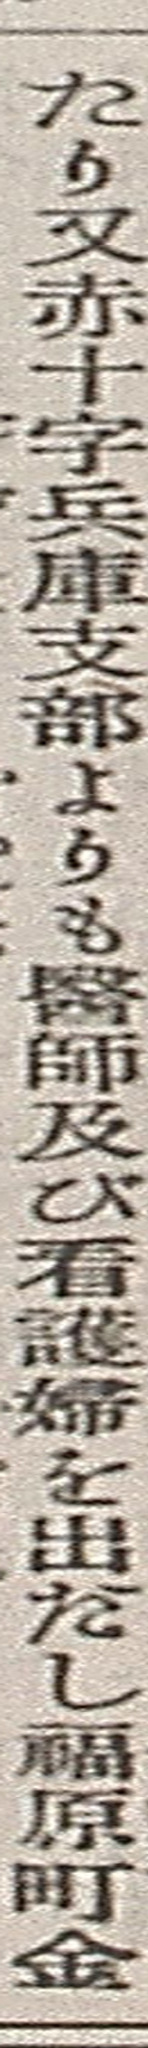たり又赤十字兵庫支部よりも医師及び看護婦を出だし福原町金
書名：風俗畫報臨時増刊第百二十八號　洪水被害録（下）
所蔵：東京大学地震研究所図書室 Earthquake Research Institute Library, The University of Tokyo, JAPAN
